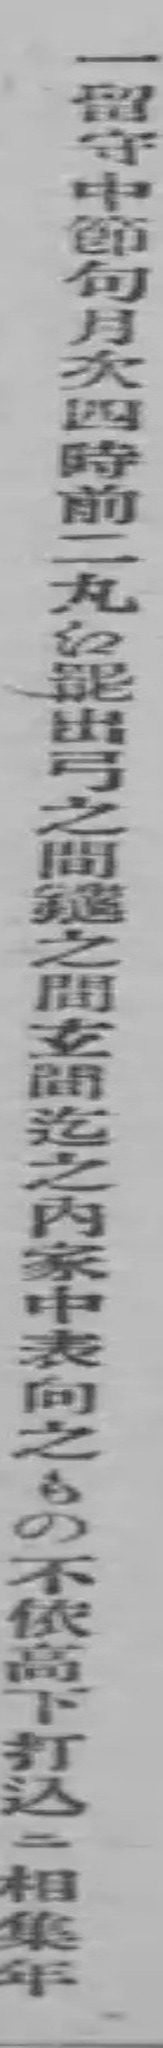一留守中節句月次四時前二丸え罷出弓之間鑓之間玄間迄之内家中表向之もの不依高下打込ニ相集年
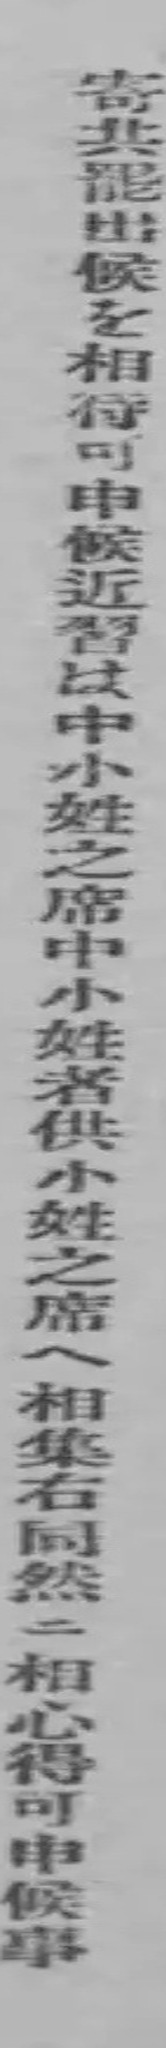寄共罷出候を相待可申候近習は中小姓之席中小姓者供小姓之席へ相集右同然ニ相心得可申候事
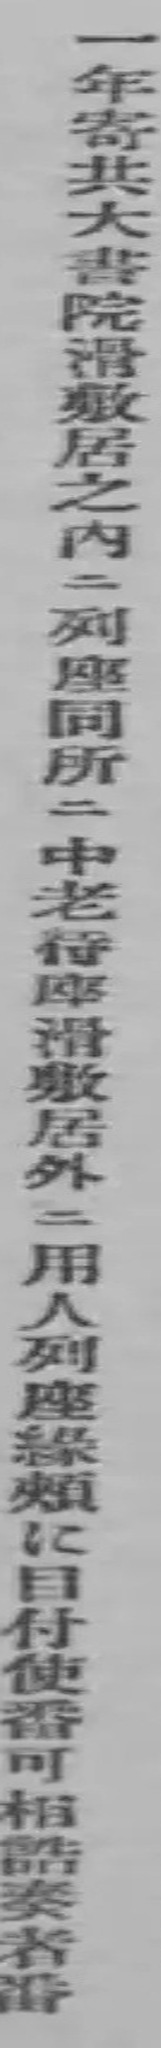一年寄共大書院滑敷居之内ニ列座同所ニ中老待座滑敷居外ニ用人列座縁頬に目付使番可相誥奏者番
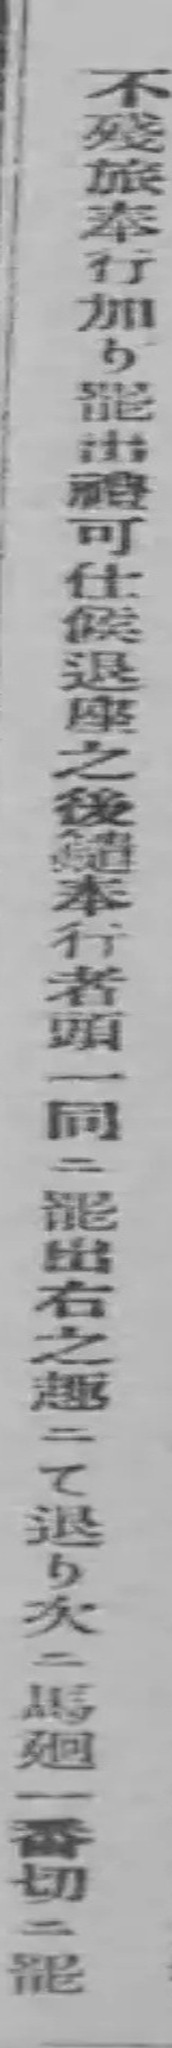不残旅奉行加り罷出礼可仕候退座之後鑓奉行者頭一同ニ罷出右之趣ニて退り次ニ馬廻一番切ニ罷
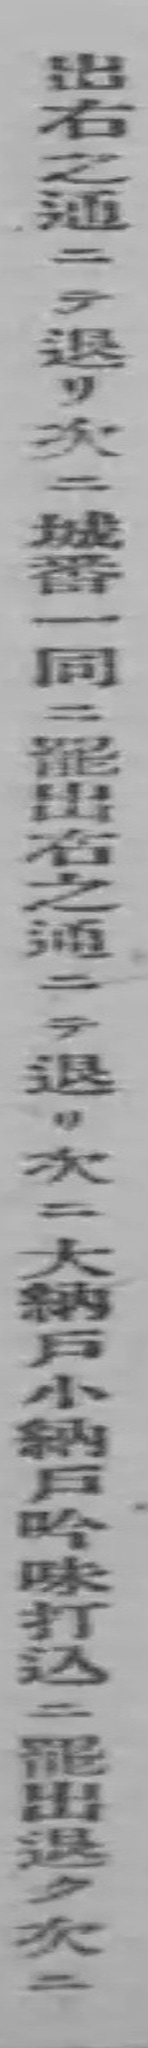出右之通ニテ退リ次ニ城番一同ニ罷出右之通ニテ退リ次ニ大納戸小納戸吟味打込ニ罷出退ク次ニ
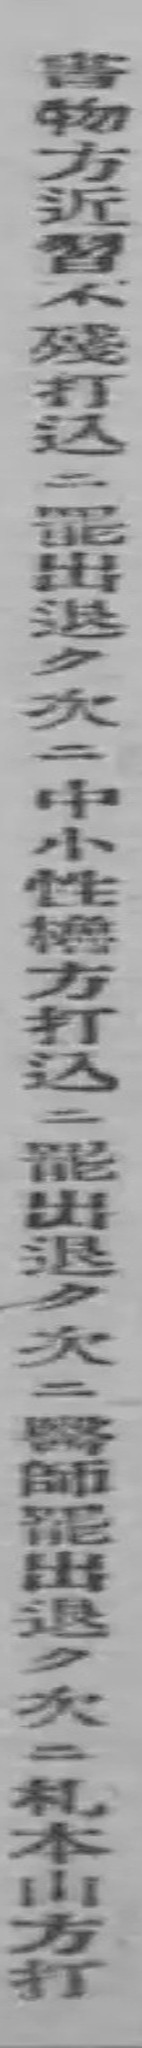書物方近習不残打込ニ罷出退ク次ニ中小性櫓方打込ニ罷出退ク次ニ医師罷出退ク次ニ札本山方打
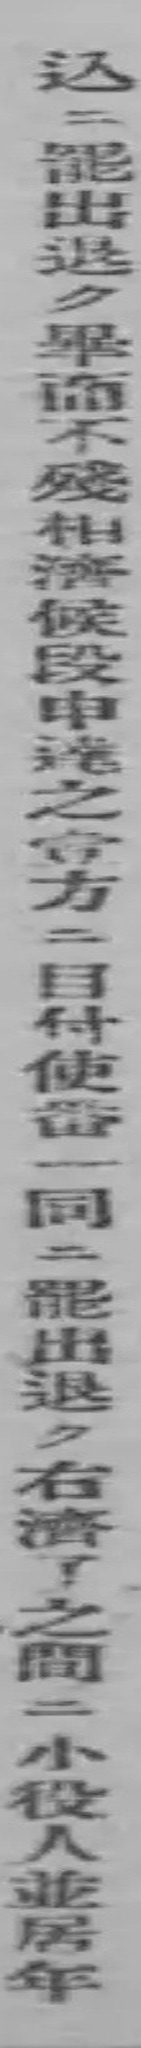込ニ罷出退ク畢而不残相済候段申達之壱方ニ目付使番一同ニ罷出退ク右済了之間ニ小役人並居年
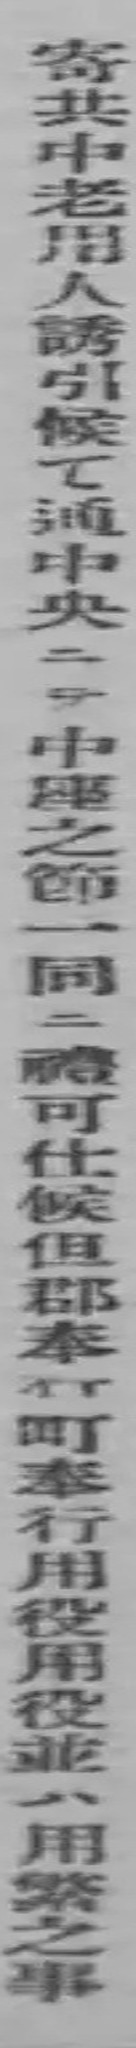寄共中老用人誘引候て通中央ニテ中座之節一同ニ礼可仕候但郡奉行町奉行用役用役並は用繁之事
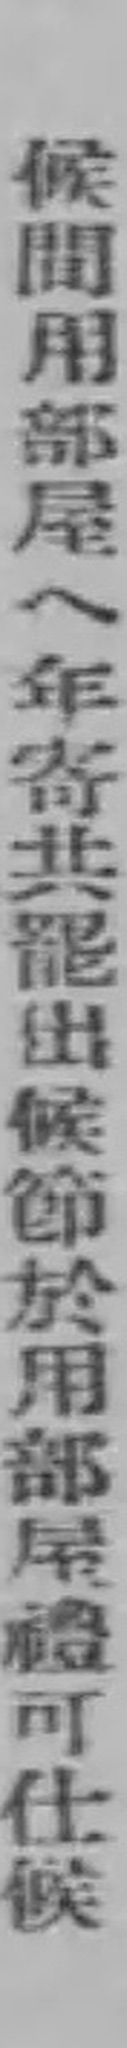候間用部屋へ年寄共罷出候節於用部屋礼可仕候
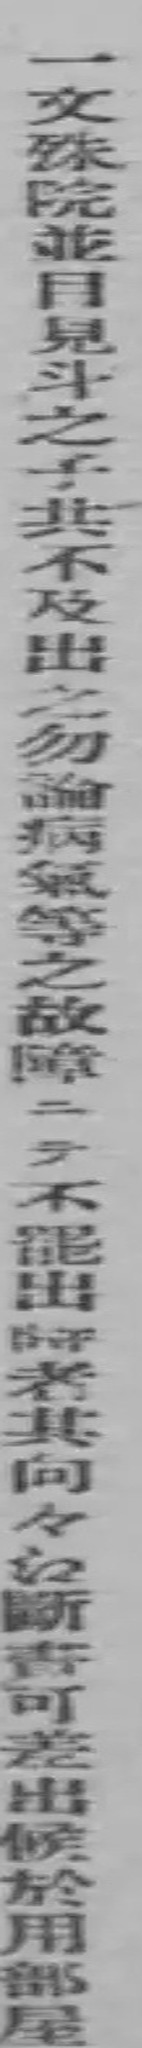一文殊院並目見斗之子共不及出之勿論病気等之故障ニテ不罷出時者其向々え断書可差出候於用部屋
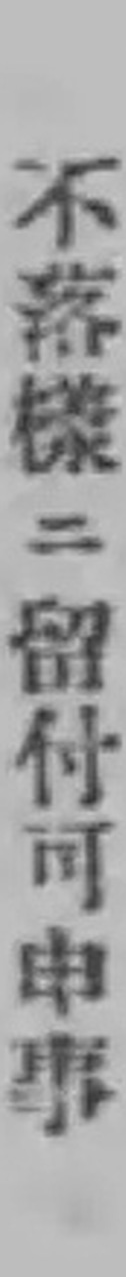不落様ニ留付可申事
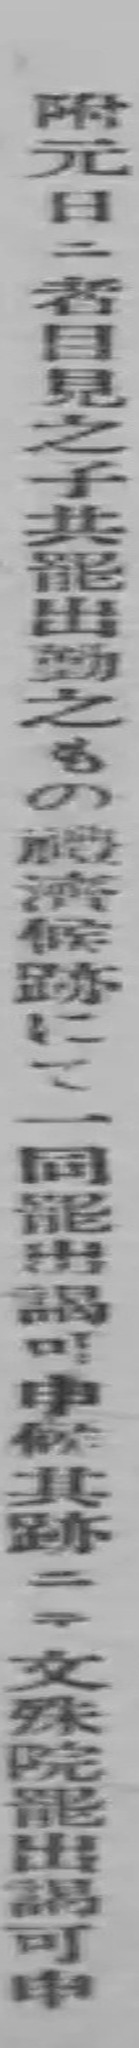附元日ニ者目見之子共罷出勤之もの礼済候跡にて一同罷出謁可申候其跡ニテ文殊院罷出謁可申
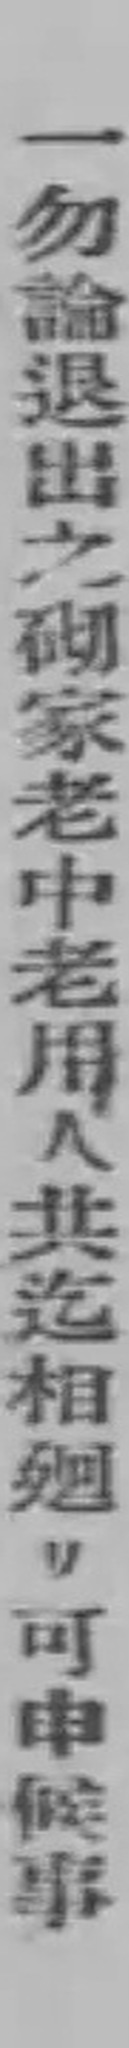一勿論退出之砌家老中老用人共迄相廻リ可申候事
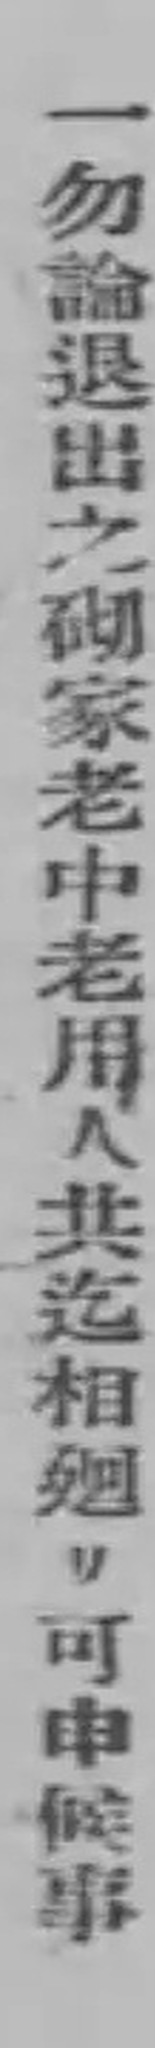一勿論退出之砌家老中老用人共迄相廻リ可申候事
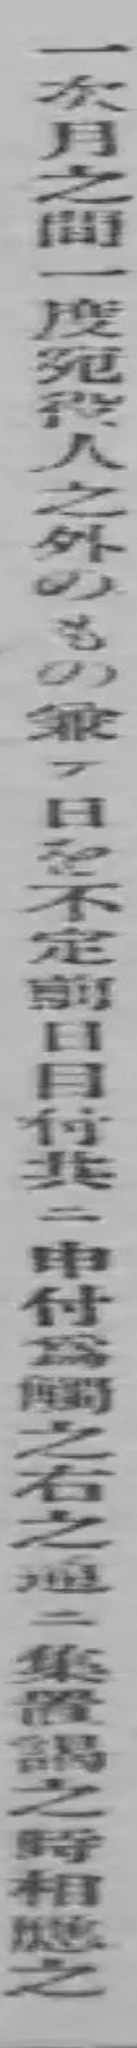一次月之間一度宛役人之外のもの兼テ日を不定前日目付共ニ申付為触之右之通ニ集置謁之時相応之
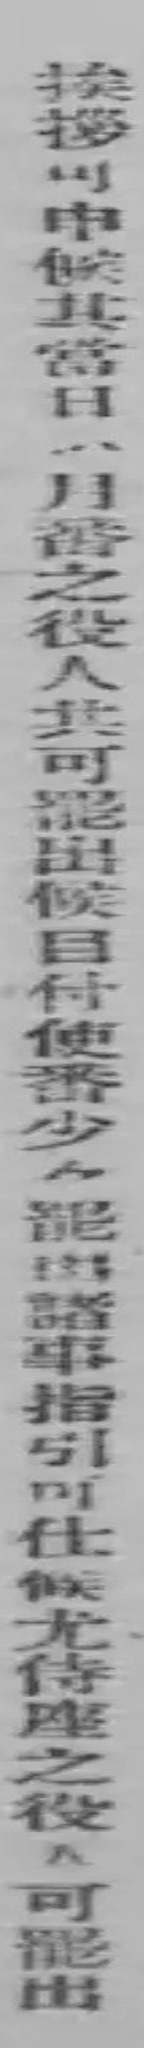挨拶可申候其当日は月番之役人共可罷出候目付使番少々罷出諸事指引可仕候尤侍座之役人可罷出
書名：豊橋市史談
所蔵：国立国会図書館 National Diet Library, JAPAN
